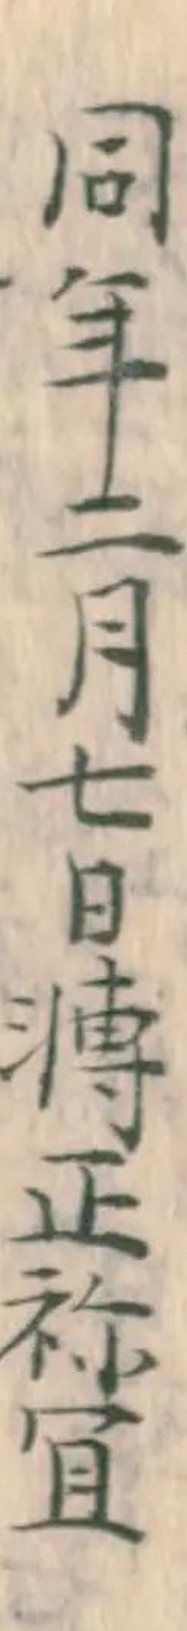同年二月七日転正祢宜
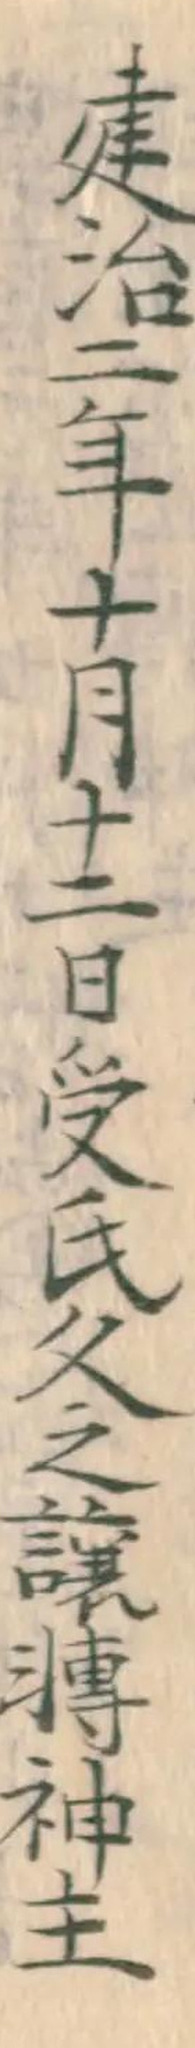建治二年十月十二日受氏久之謹転神主
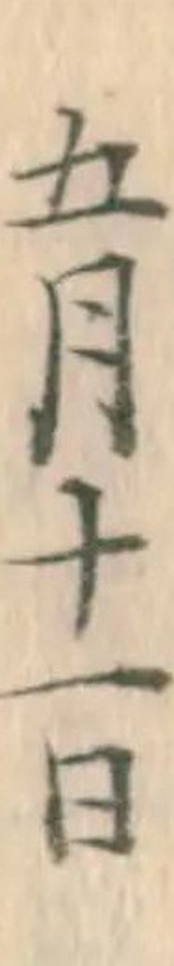五月十一日
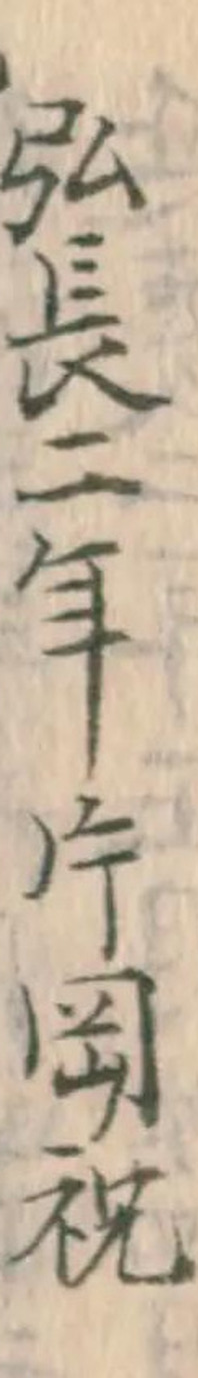弘長二年片岡祝
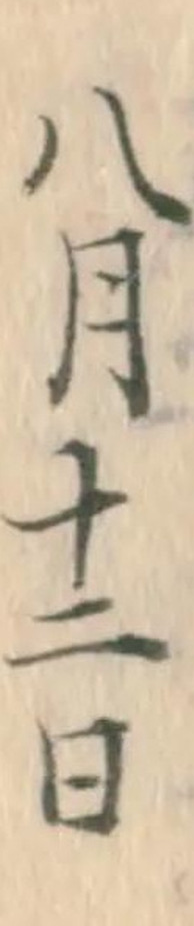五月十一日
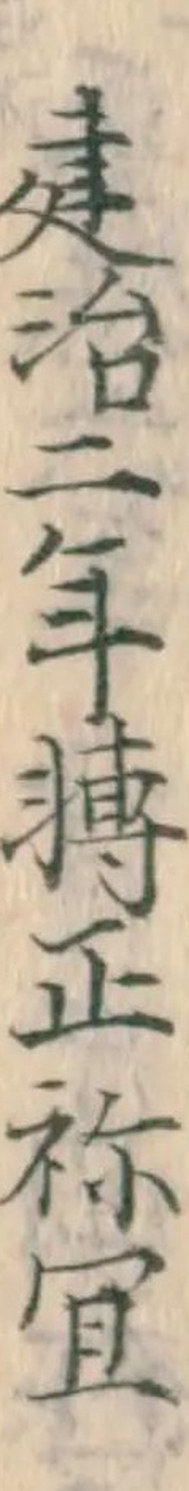建治二年転正祢宜
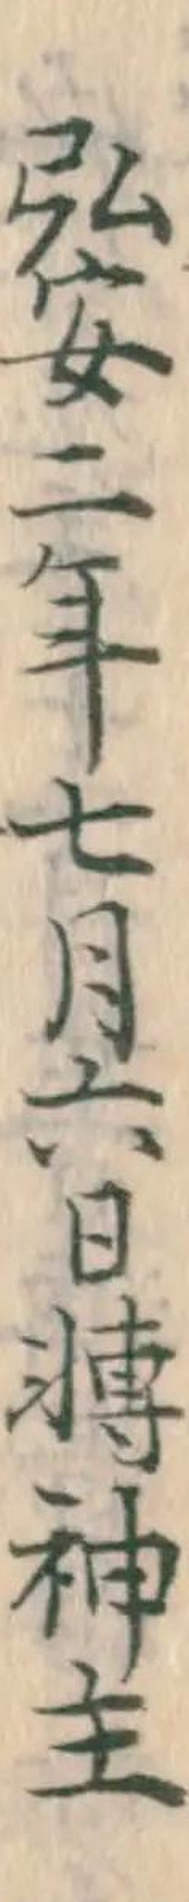弘安二年七月六日転神主
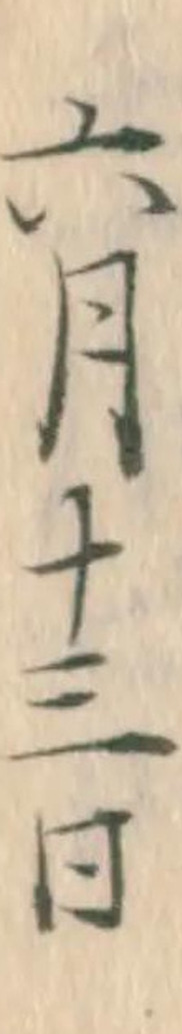五月十一日
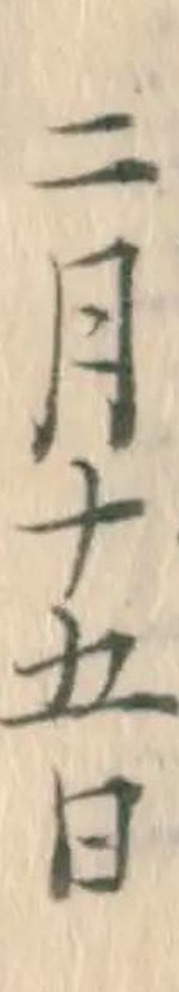五月十一日
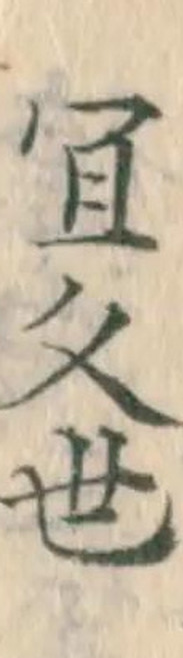宜久世
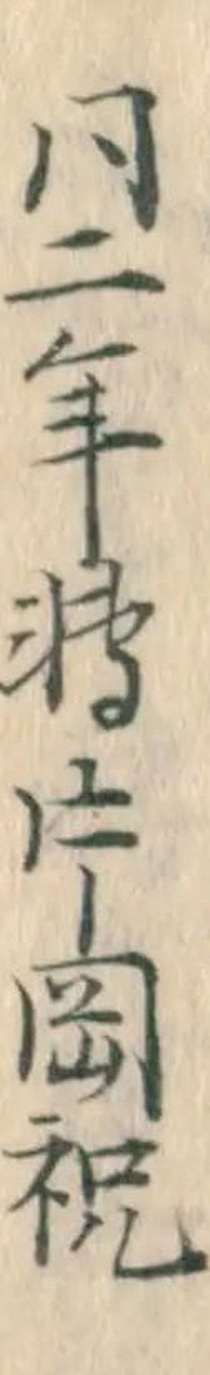同二年転片岡祝
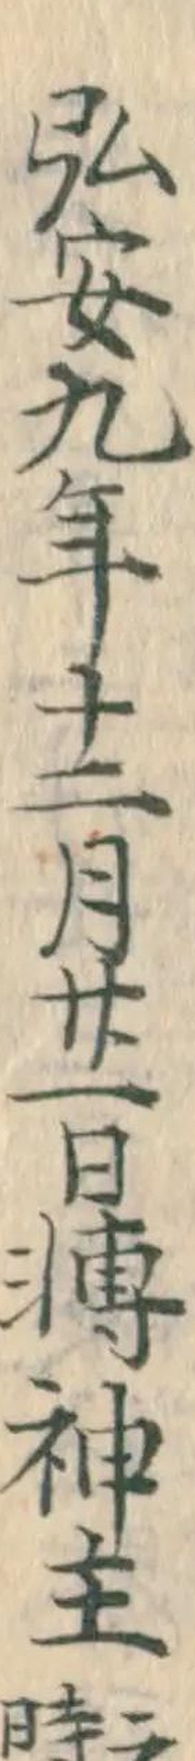弘安二年七月六日転神主

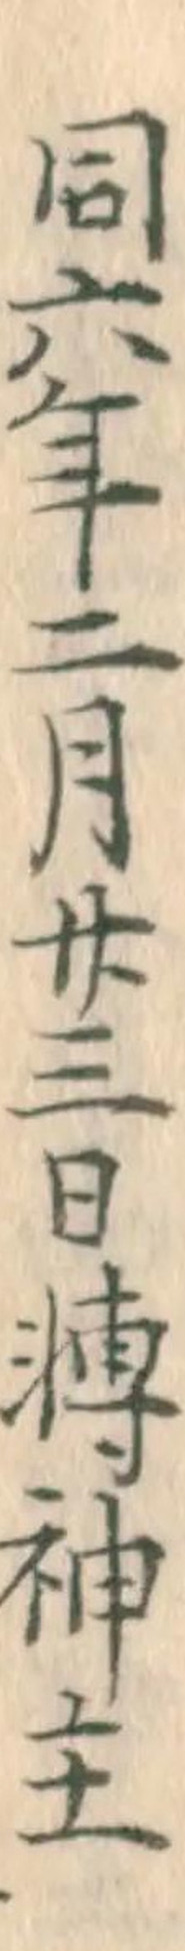同六年二月廿三日轉神主
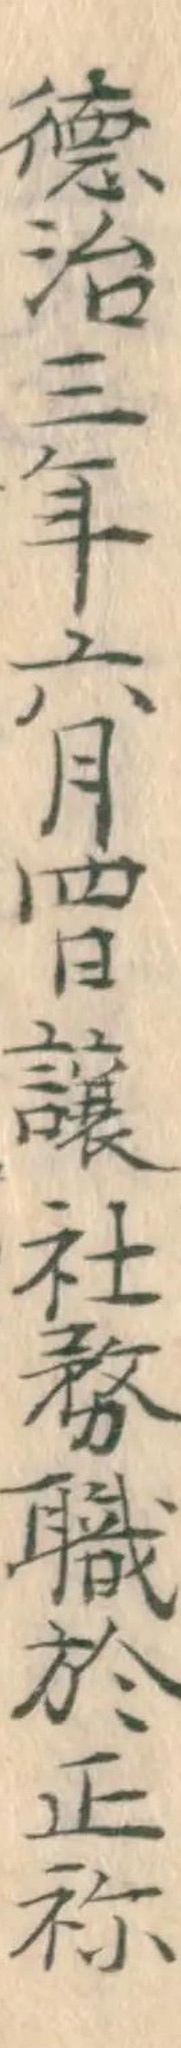徳治三年六月四日譲社務職於正祢
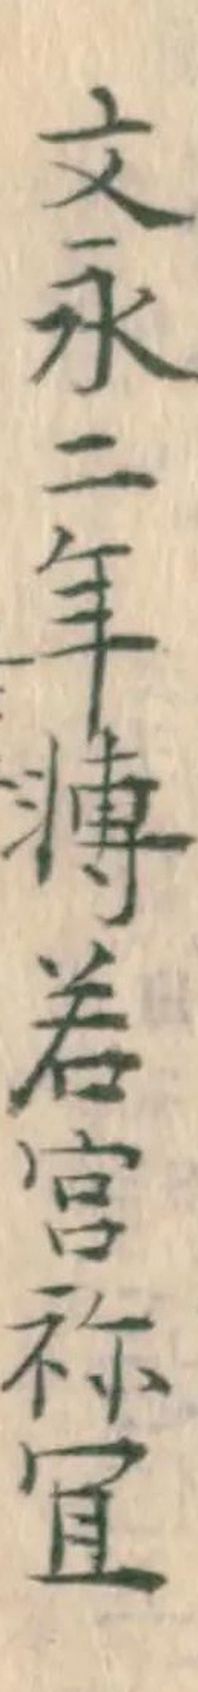文永二年転若宮祢宜
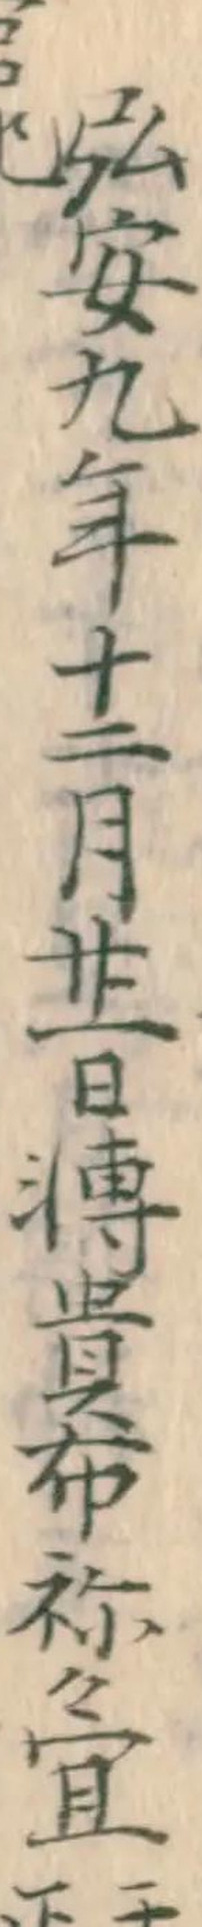後乾元二年四月廿一日転貴布祢々宜
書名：賀茂社記録. 第23冊
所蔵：国立国会図書館 National Diet Library, JAPAN
